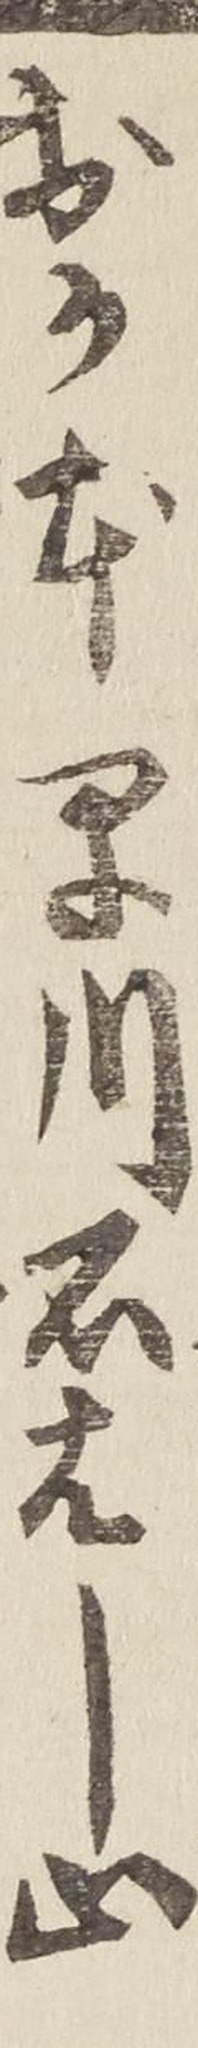おか本早川石はし山
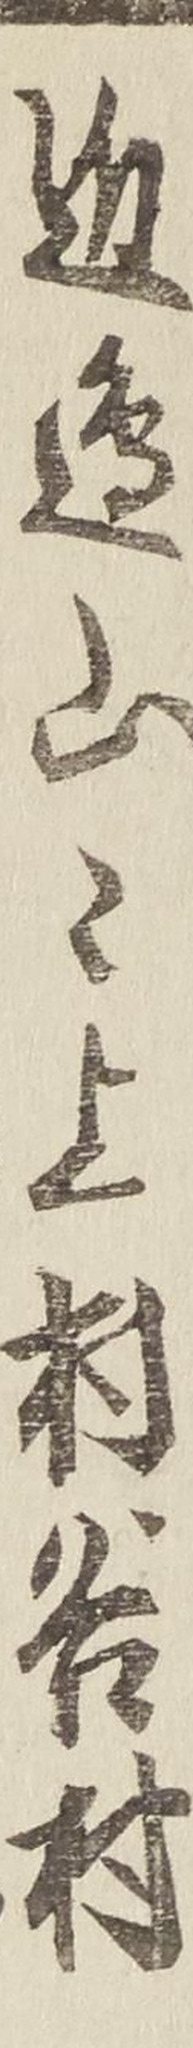近辺山々上村谷村
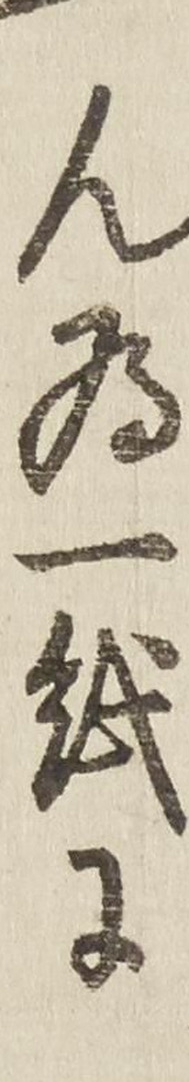ん為一紙に
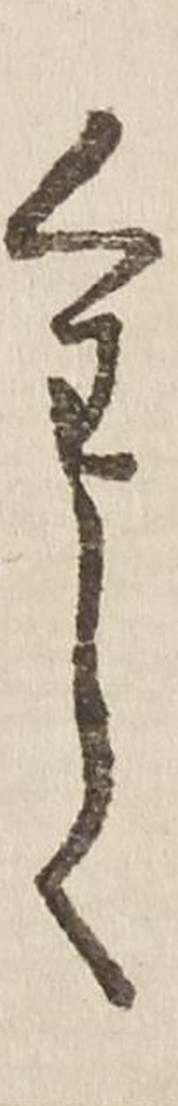くわしく
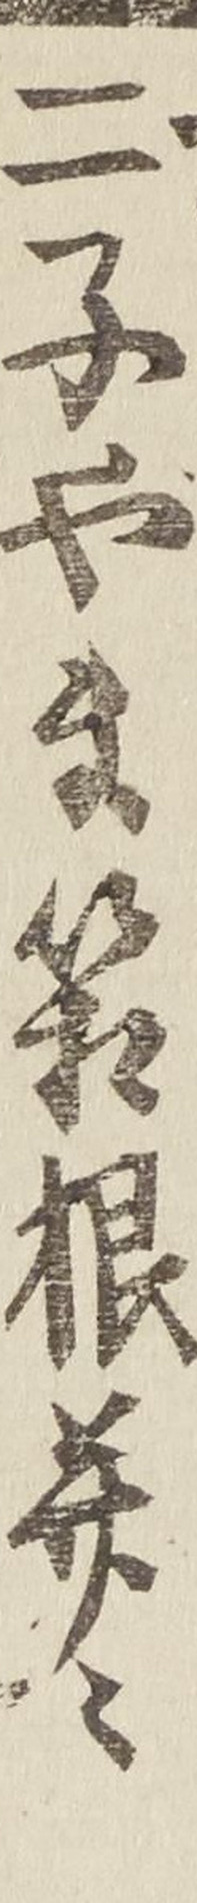二子やま箱根并に
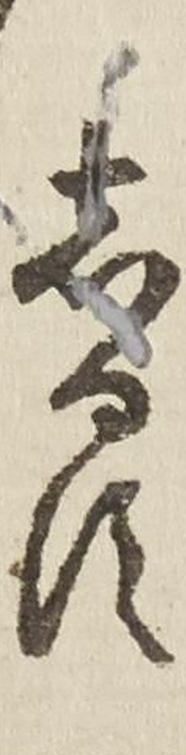しるす
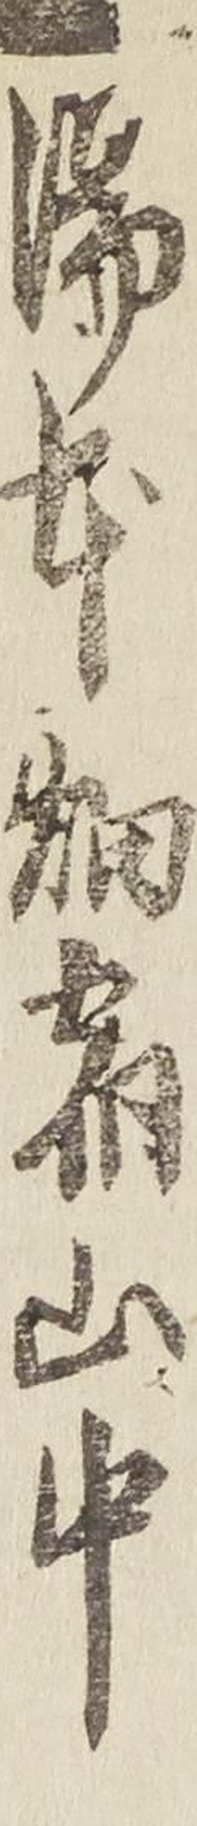湯本畑宿山中
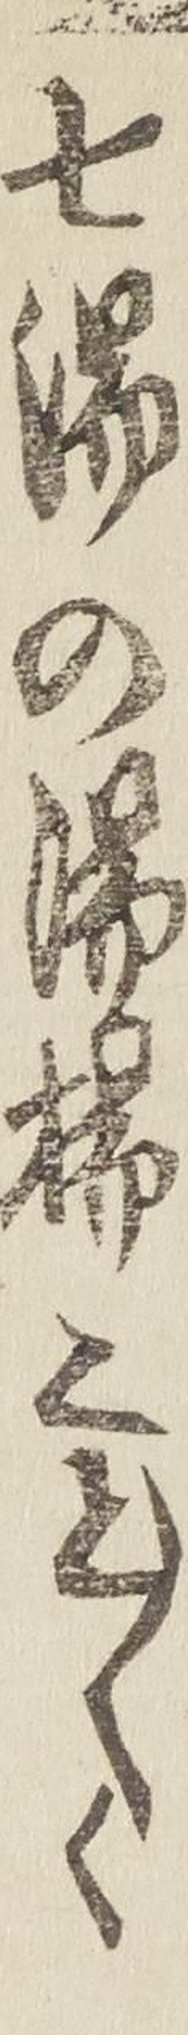七湯の湯楊こと〳〵く
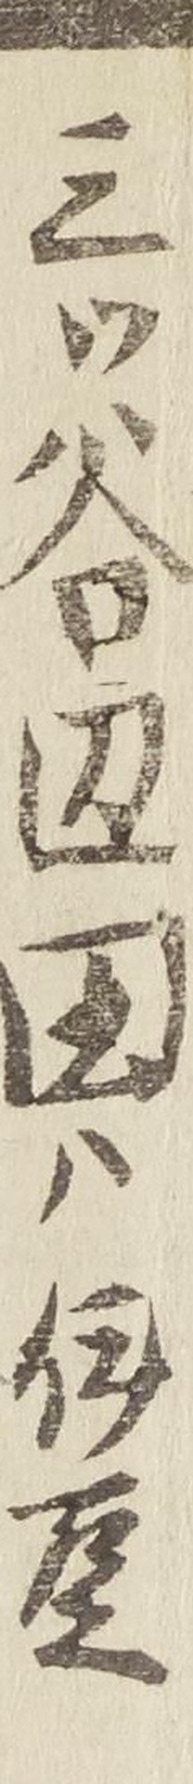三ツ谷辺田は伊豆
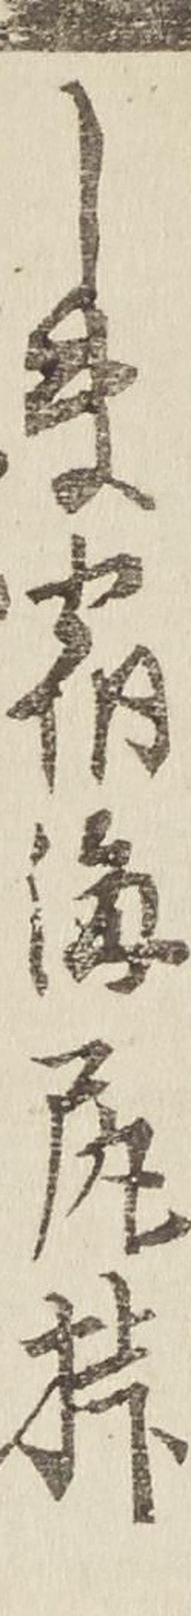しま宿海尻峠
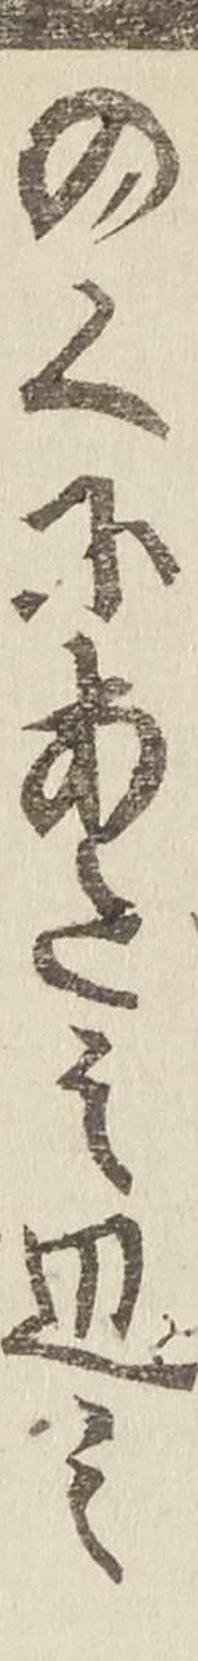のくにあたみ辺み
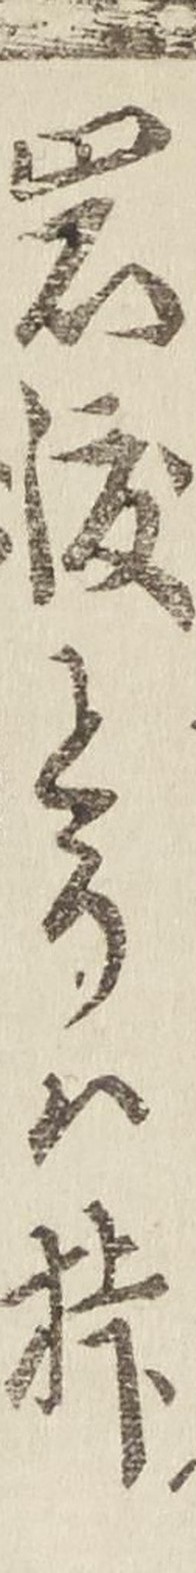岩渡とうは峠
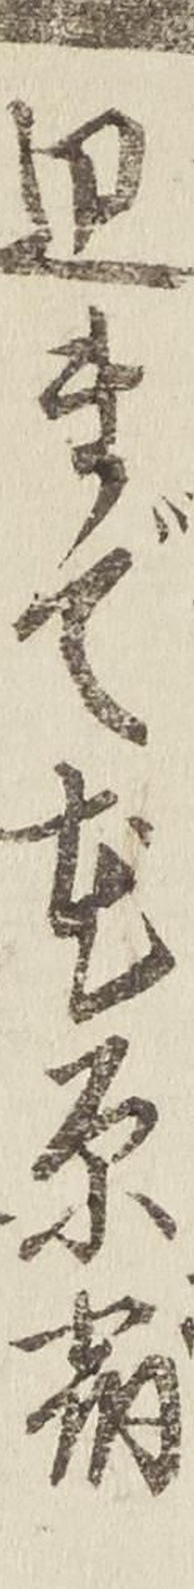辺まで尤原宿
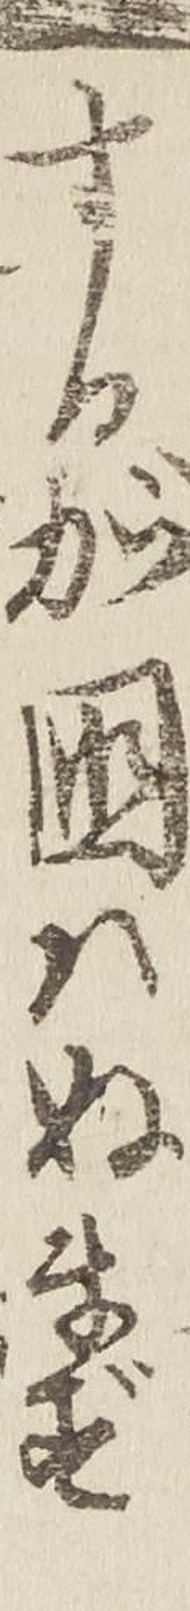するが国はぬまず
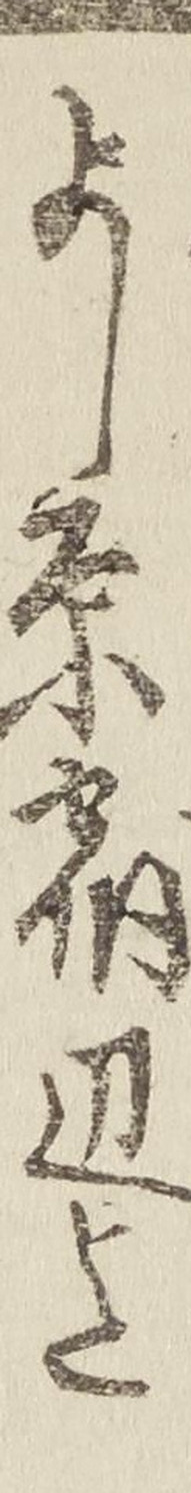よし原宿辺迄
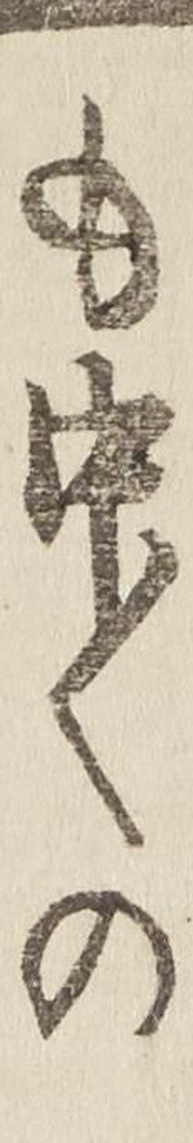も中〳〵の
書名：相模國大地震
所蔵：東京大学地震研究所図書室 Earthquake Research Institute Library, The University of Tokyo, JAPAN
